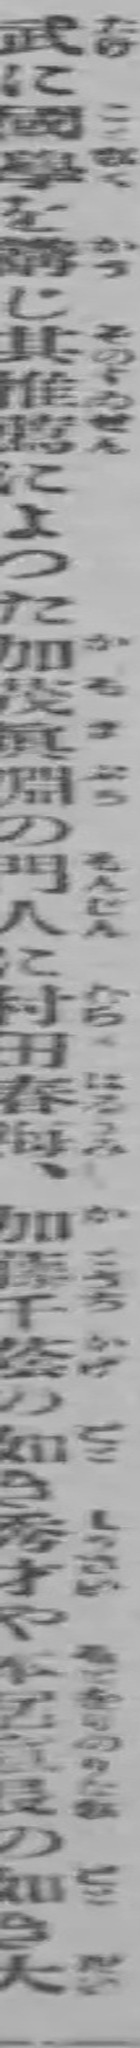武に国学を講じ其推薦によつた加茂真淵の門人に村田春海、加藤千蔭の如き秀才や本居宣長の如き大
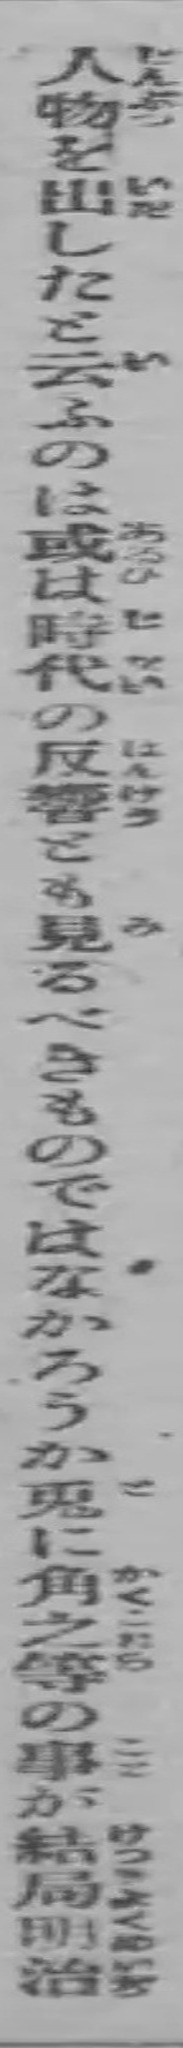人物を出したと云ふのは或は時代の反響とも見るべきものではなかろうか兎に角之等の事が結局明治
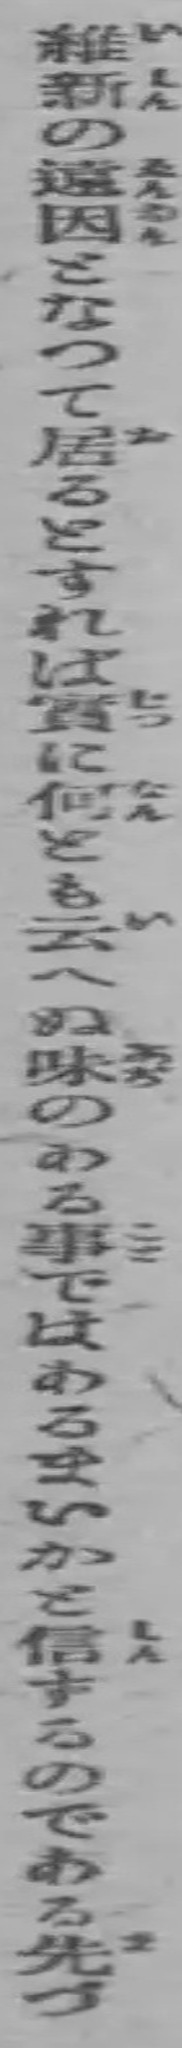維新の遠因となつて居るとすれば実に何とも云へぬ味のある事ではあるまいかと信ずるのである先づ

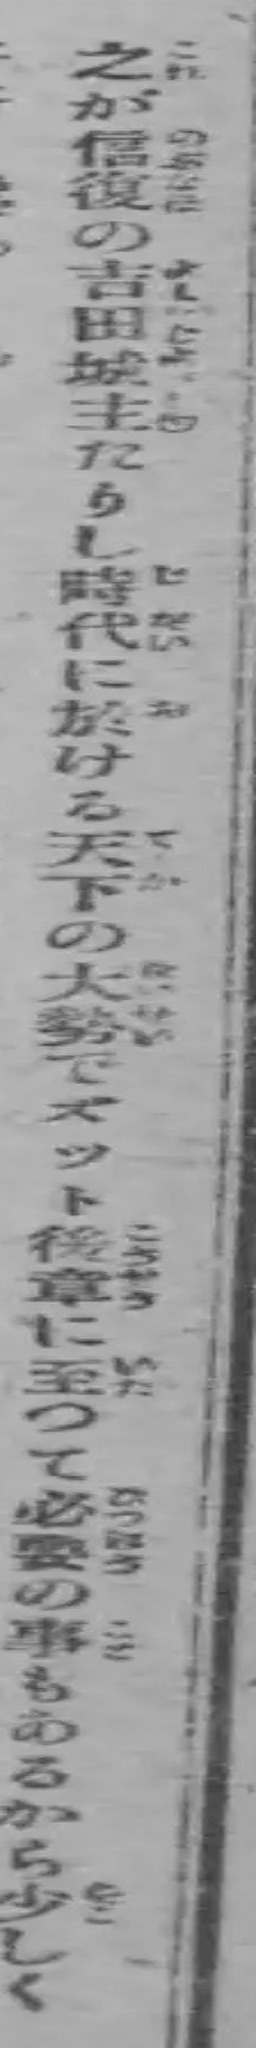之が信復の吉田城主たりし時代に於ける天下の大勢でズツト後章に至つて必要の事もあるから少しく
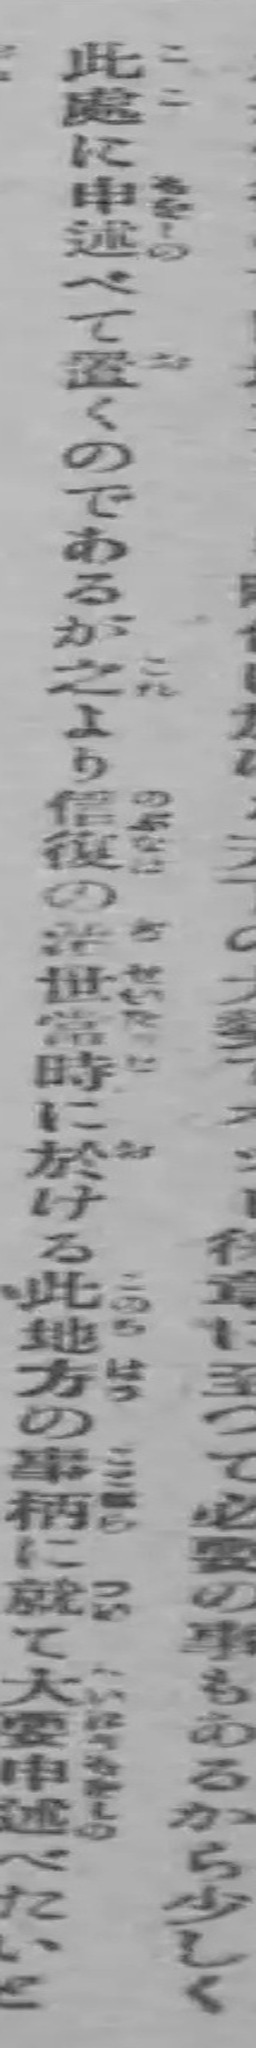此処に申述べて置くのであるが之より信復の治世当時に於ける此地方の事柄に就て大要申述べたいと
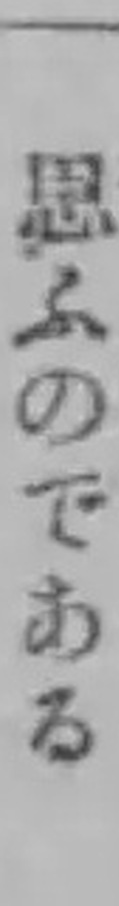思ふのである
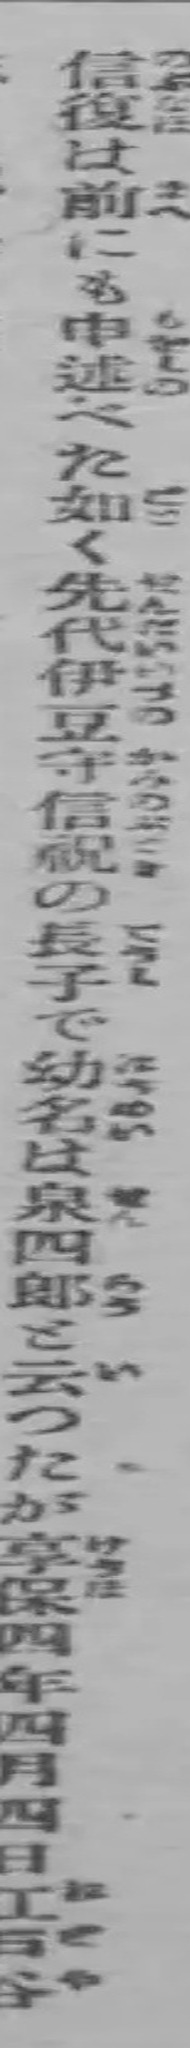信復は前にも申述べた如く先代伊豆守信祝の長子で幼名は泉四郎と云つたが享保四年四月四日江戸谷
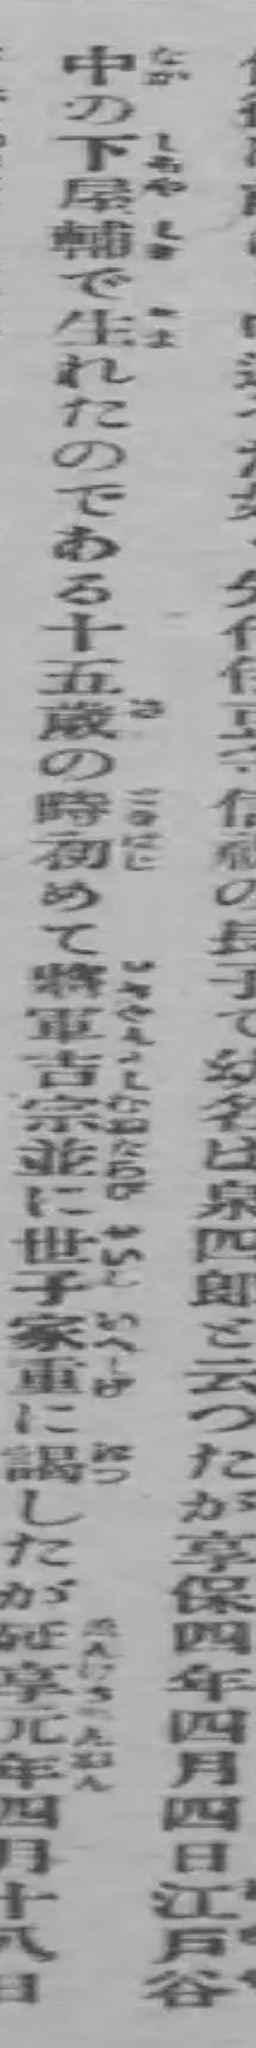中の下屋輔で生れたのである十五歳の時初めて将軍吉宗並に世子家重に謁したが延享元年四月十八日
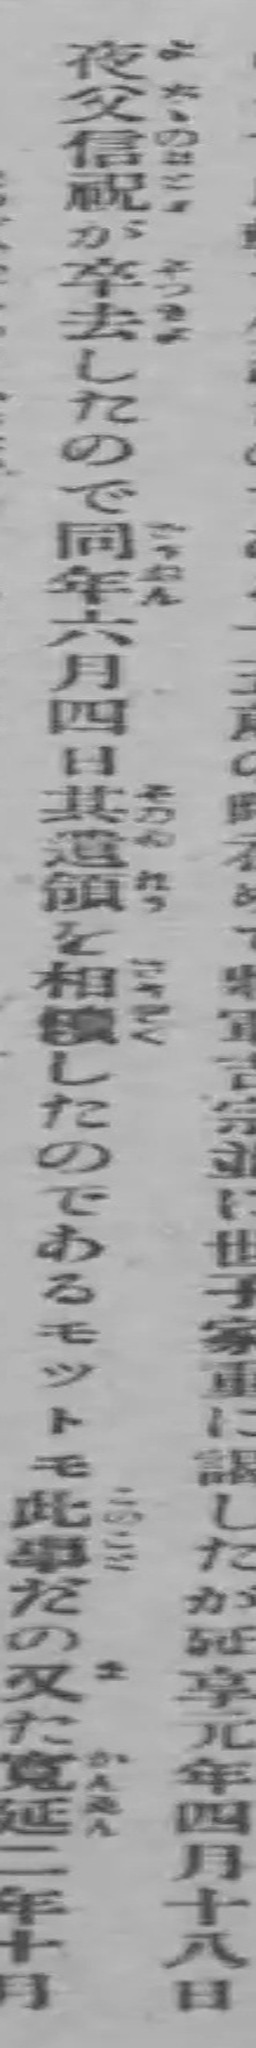夜父信祝が卒去したので同年六月四日其遺領を相続したのであるモツトモ此事だの又た寛延二年十月
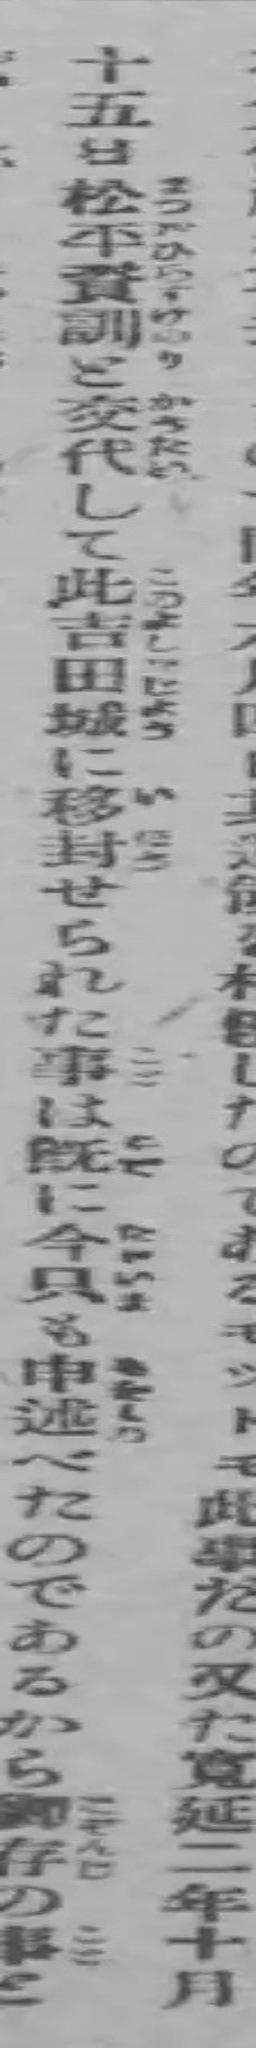十五日松平資訓と交代して此吉田城に移封せられた事は既に只今も申述べたのであるから御存の事と
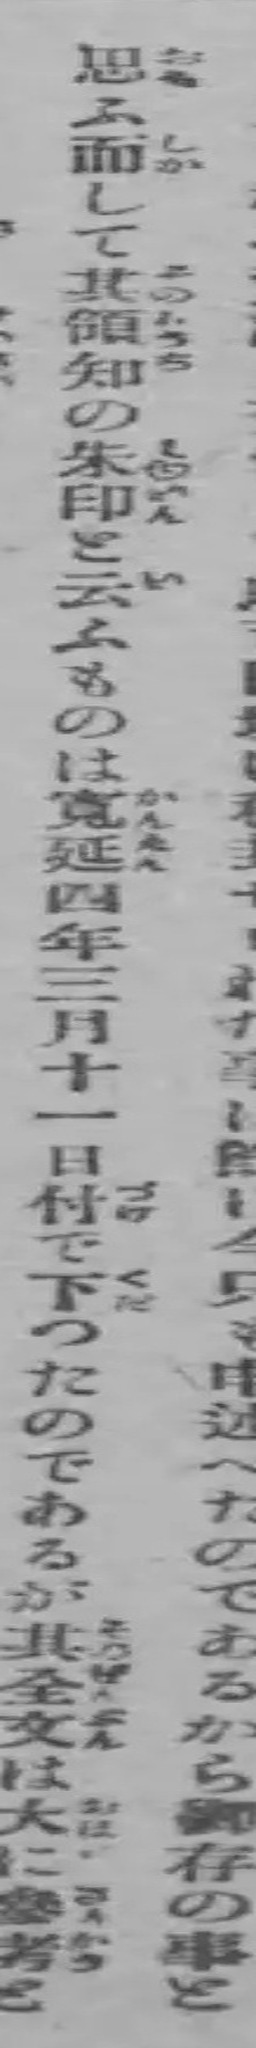思ふ而して其領地の朱印と云ふものは寛延四年三月十一日付で下つたのであるが其全文は大に参考と
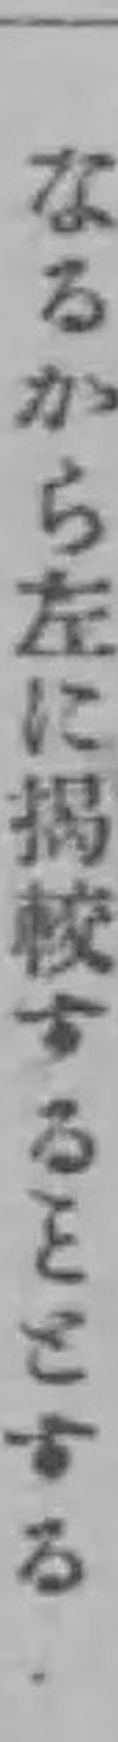なるから左に掲較することとする
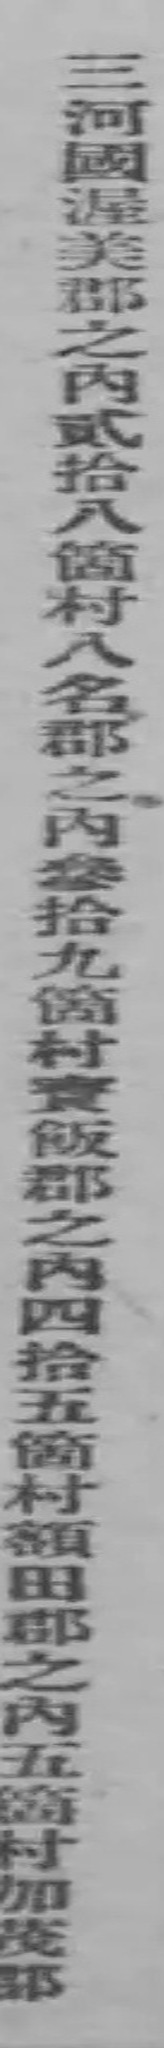三河国渥美郡之内弐拾八箇村八名郡之内参拾九箇村宝飯郡之内四拾五箇村額田郡之内五箇村加茂郡
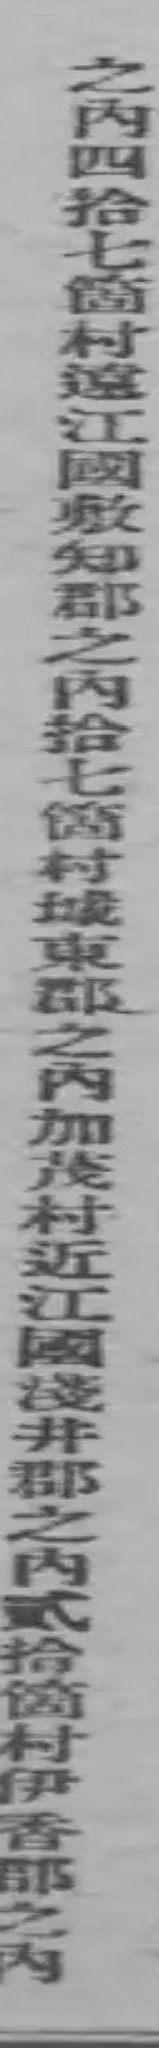之内四拾七箇村遠江国敷知郡之内拾七箇村城東郡之内加茂村近江国浅井郡之内弐拾箇村伊香郡之内
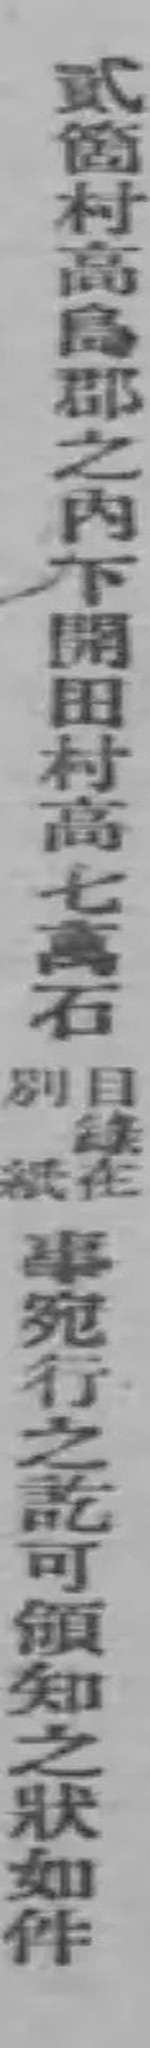弐箇村高島郡之内下開田村高七萬石目録在別紙事宛行之訖可領地之状如件
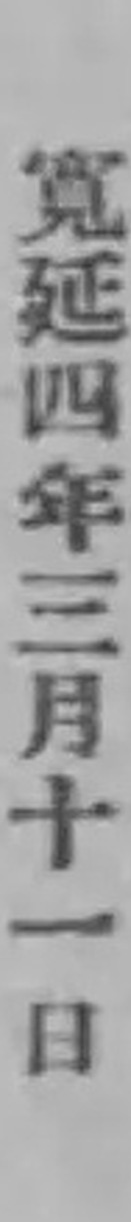寛延四年三月十一日
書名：豊橋市史談
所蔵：国立国会図書館 National Diet Library, JAPAN
